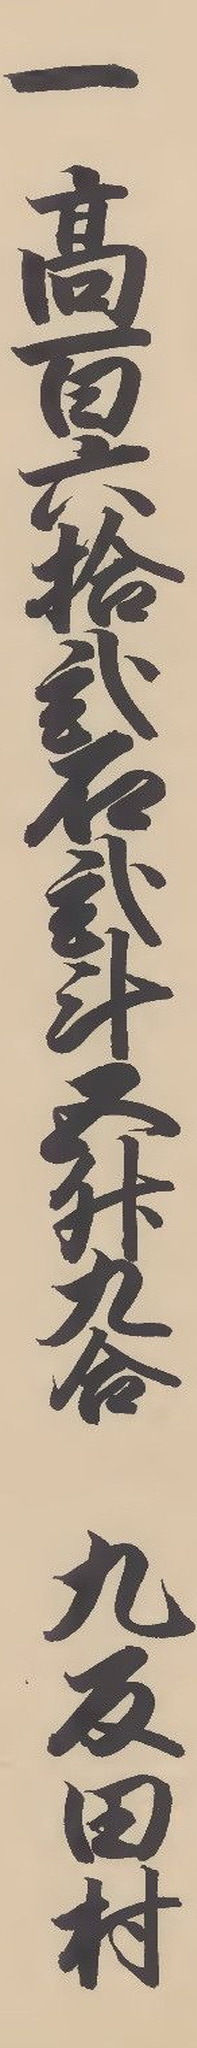一高百六拾弐石弐斗五升九合九反田村
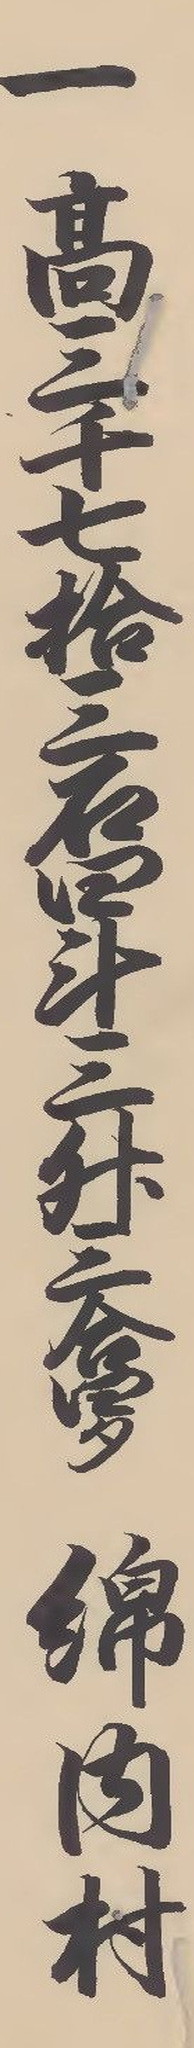一高三千七拾三石四斗三升三合四勺綿内村
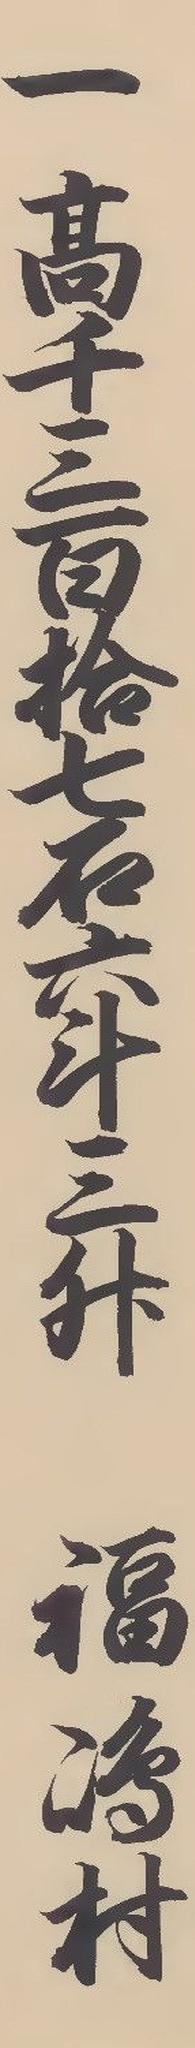一高千三百拾七石六斗三升福島村
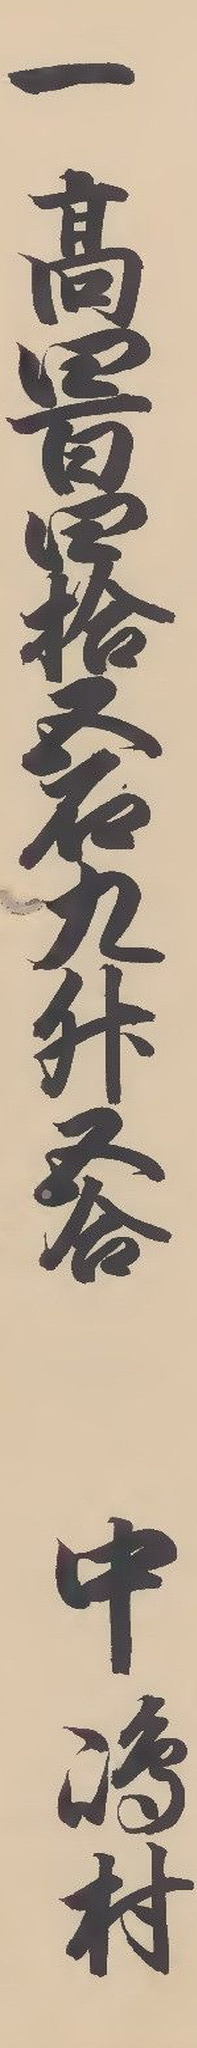一高四百四拾五石九升五合中島村

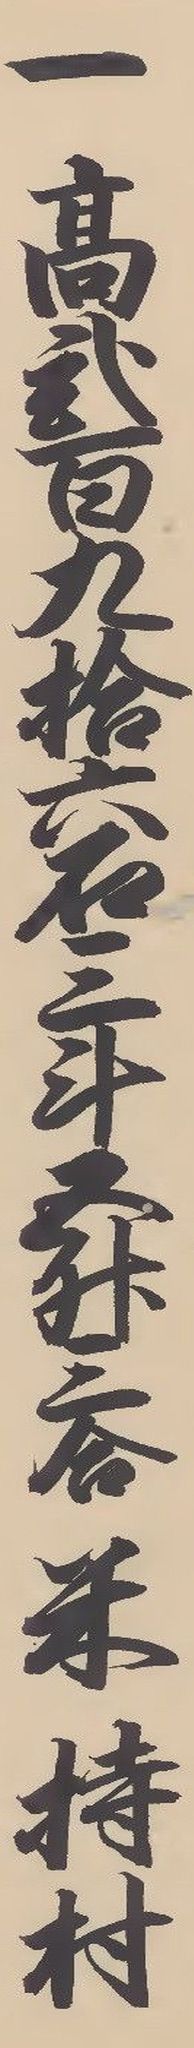一高弐百九拾六石三斗五升三合米持村
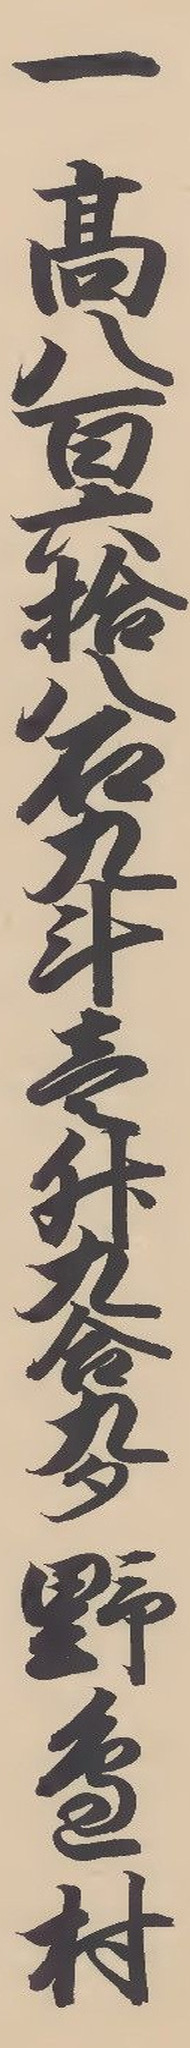一高八百六拾八石九斗壱升九合九勺野辺村
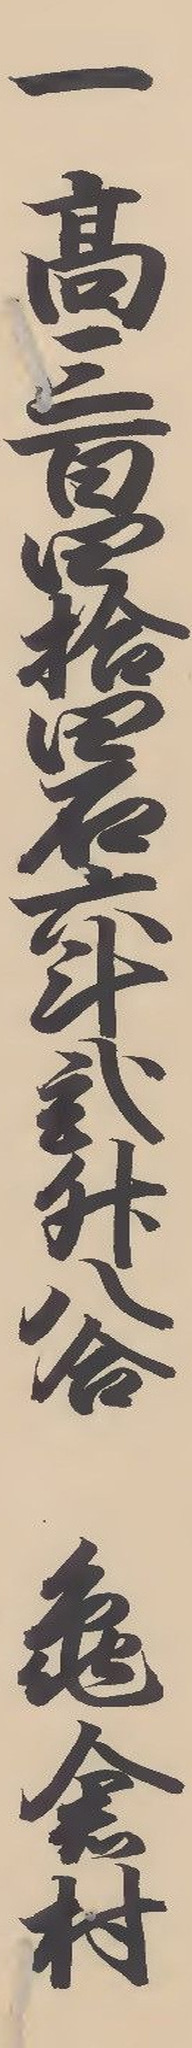一高三百四拾四石六斗弐升八合亀倉村
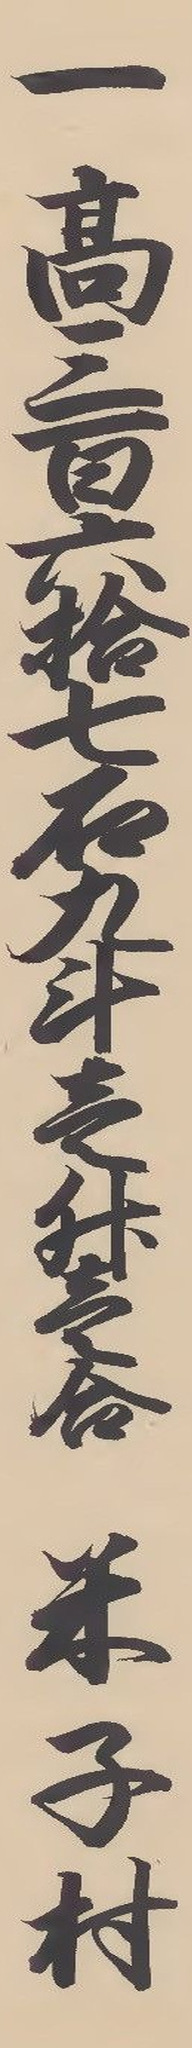一高三百六拾七石九斗壱升壱合米子村
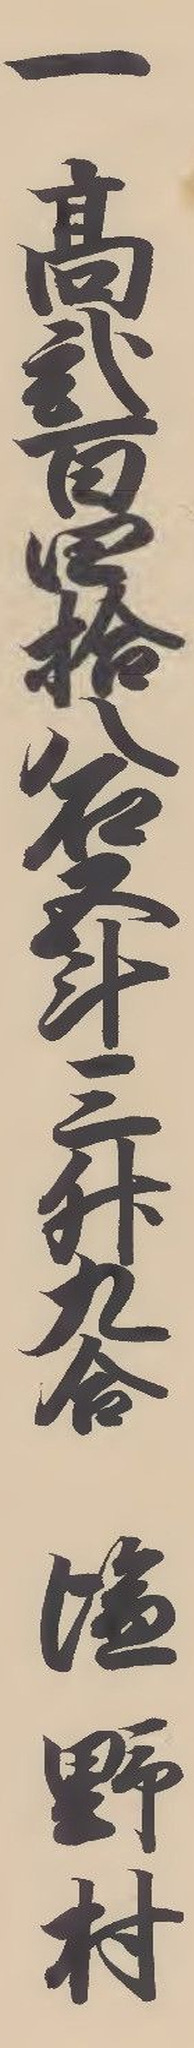一高弐百四拾八石五斗三升九合塩野村
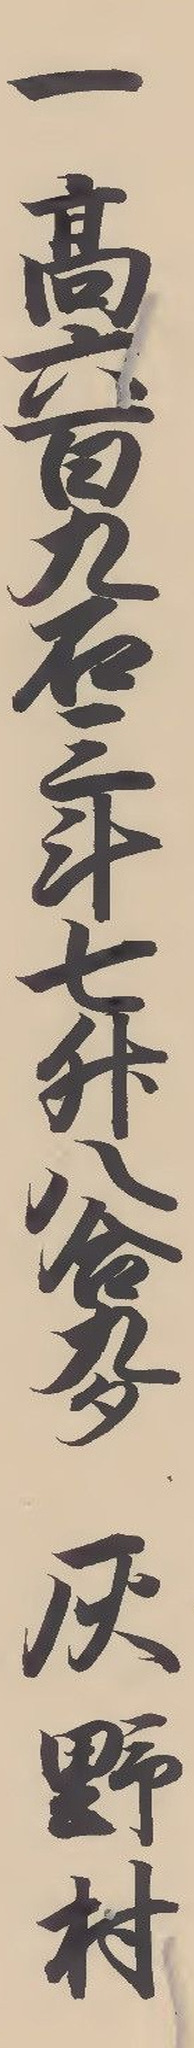一高六百九石三斗七升八合九勺灰野村
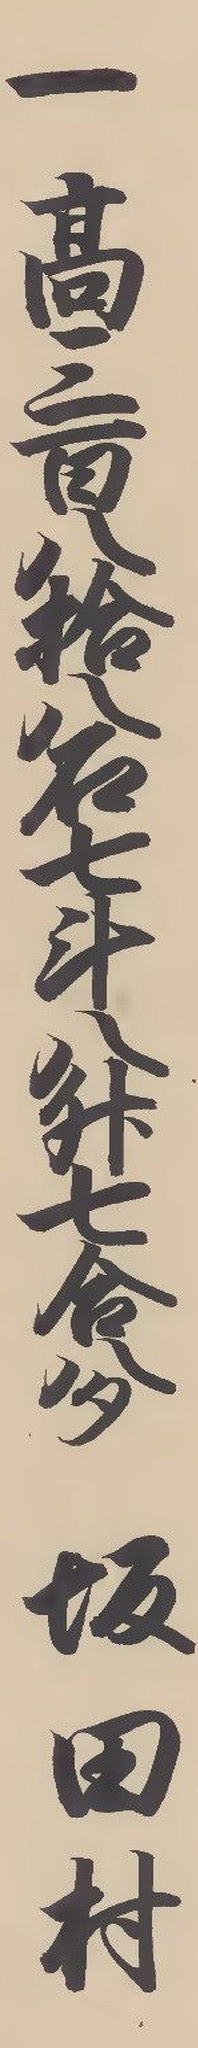一高三百八拾八石七斗八升七合八勺坂田村
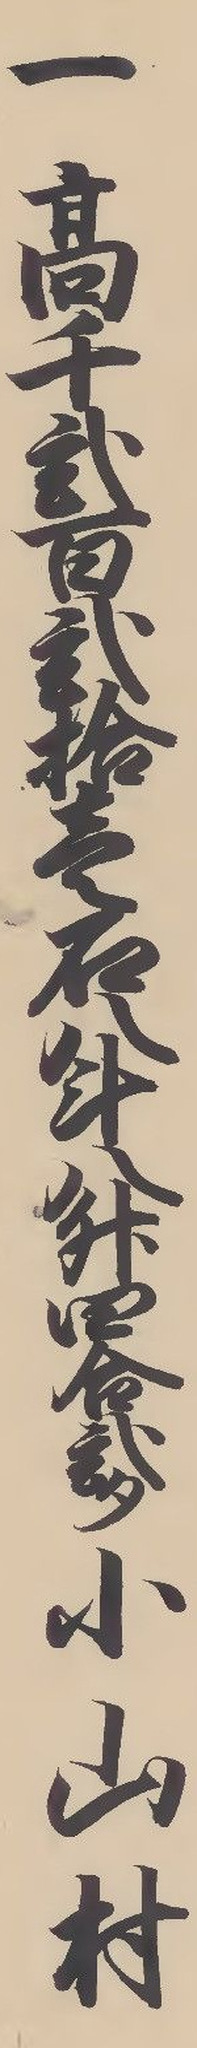一高千弐百弐拾壱石八斗八升四合弐勺小山村

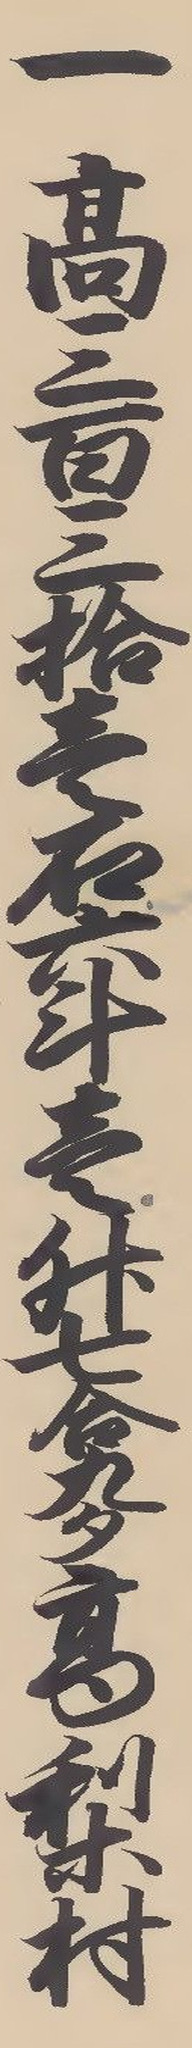一高三百三拾壱石六斗壱升七合九勺高梨村
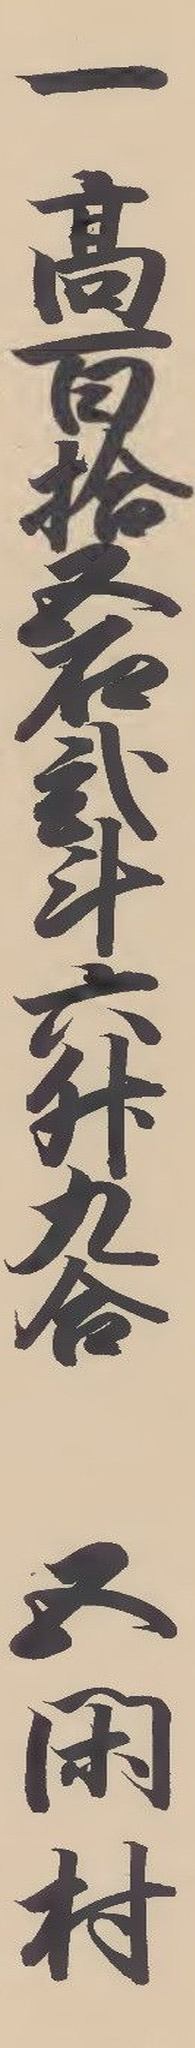一高百拾五石弐斗六升九合五閑村
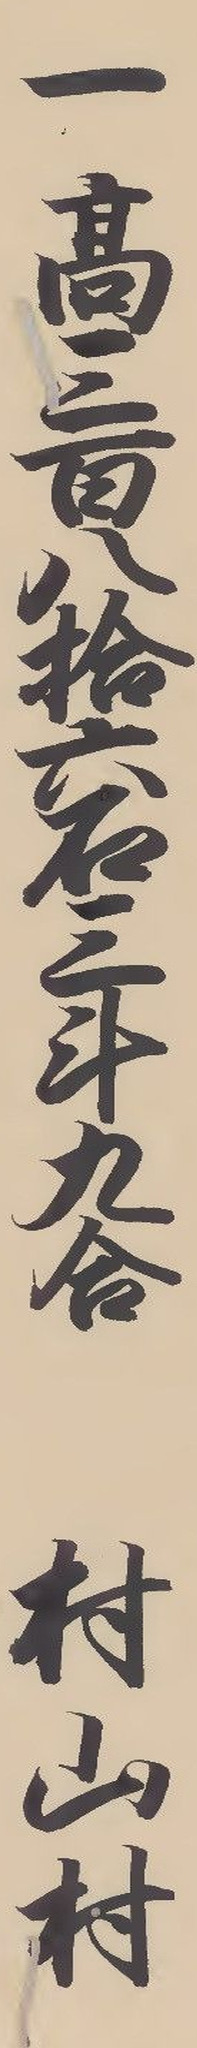一高三百八拾六石三斗九合村山村
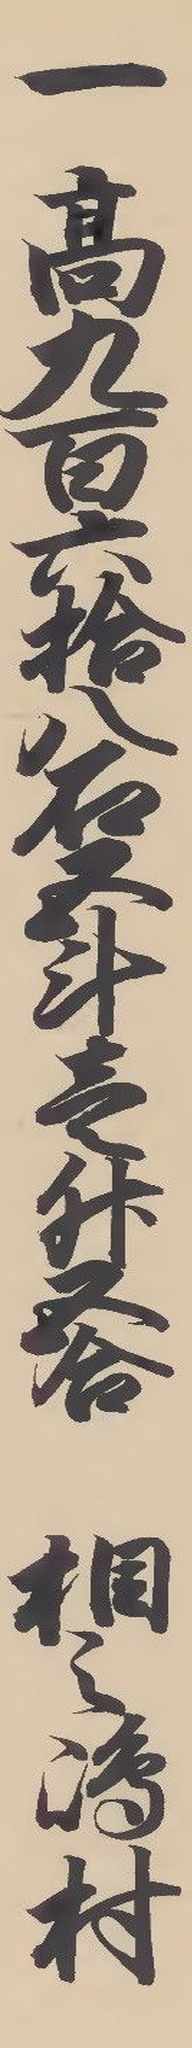一高九百六拾八石五斗壱升五合相之島村
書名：信濃国郷帳
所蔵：国立公文書館 National Archives of Japan
